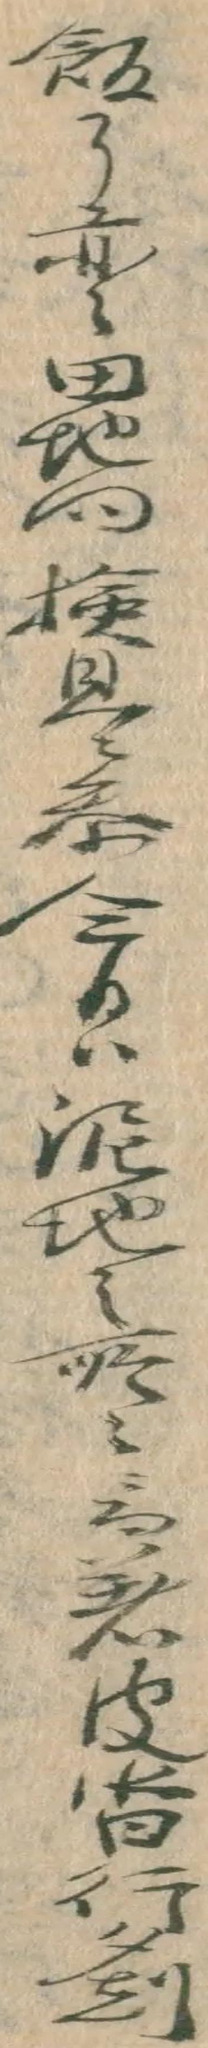飯了亦々田地向検見二参今日ハ泥地之所々二而着皮沓行夕刻
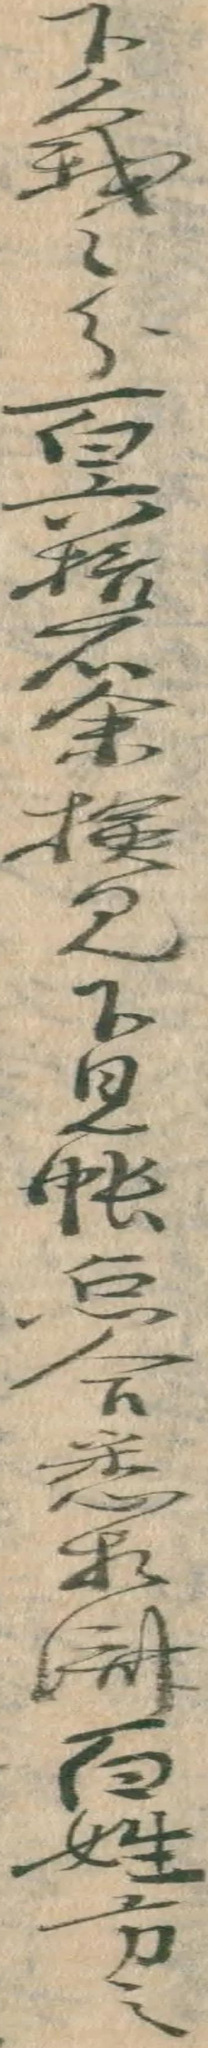下久我之分百六拾石余検見下見帳点合悉相済百姓方之
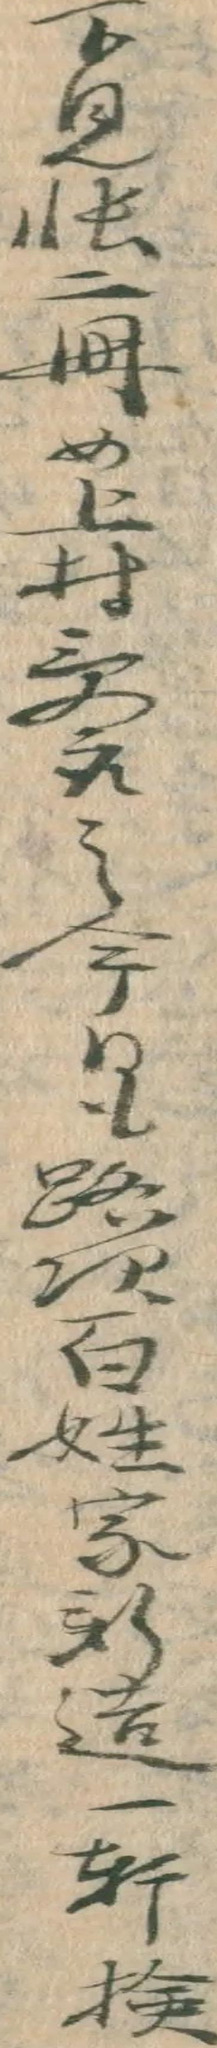下見帳二冊め如上村受取之今日も路次百姓家新造一軒検
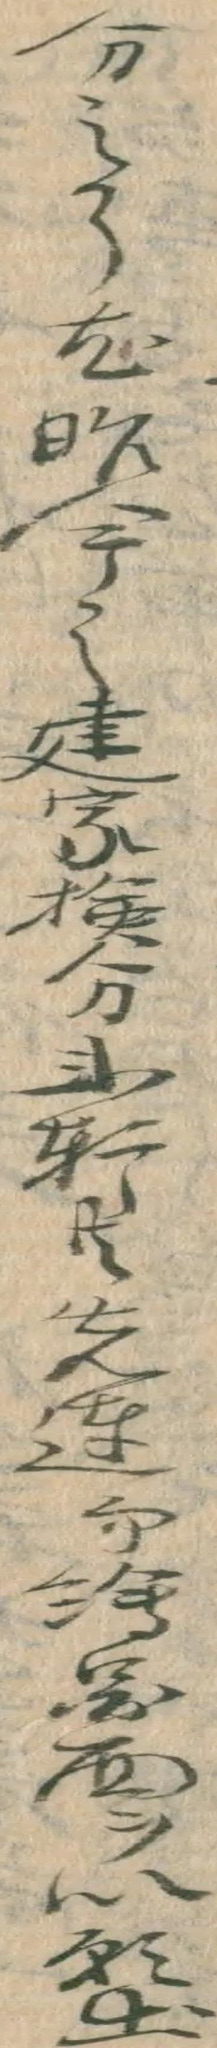分之了尤昨今之建家検分弐軒共先達而絵図面ヲ以願出
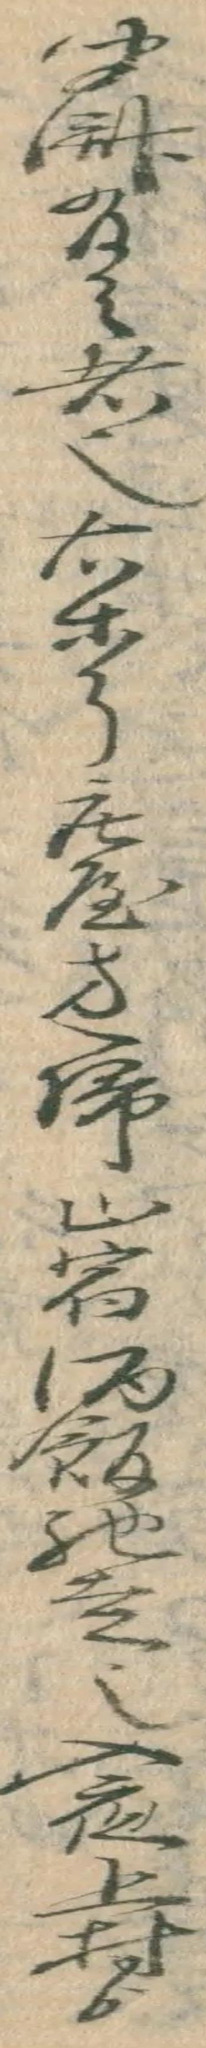聞済有之者也右等了庄屋方帰山宿酒飯馳走之入夜上村ゟ
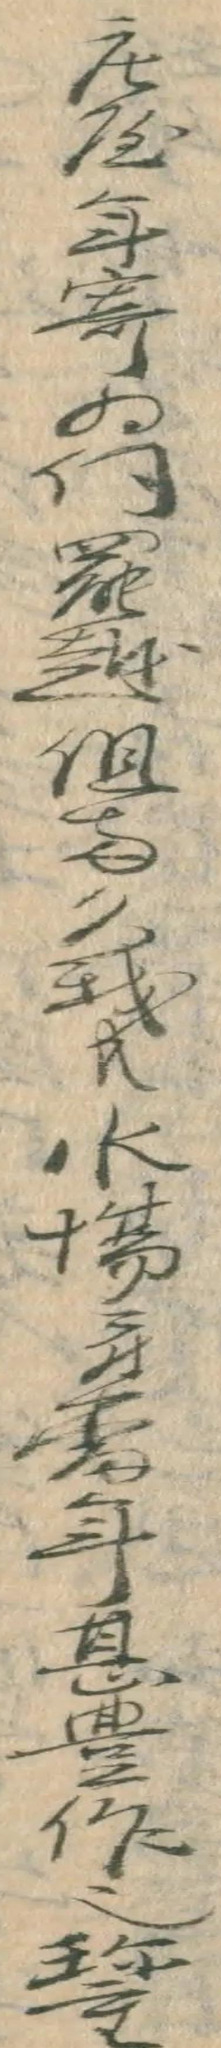庄屋年寄為伺罷越但両久我共水場ニ付當年甚豊作也珍重
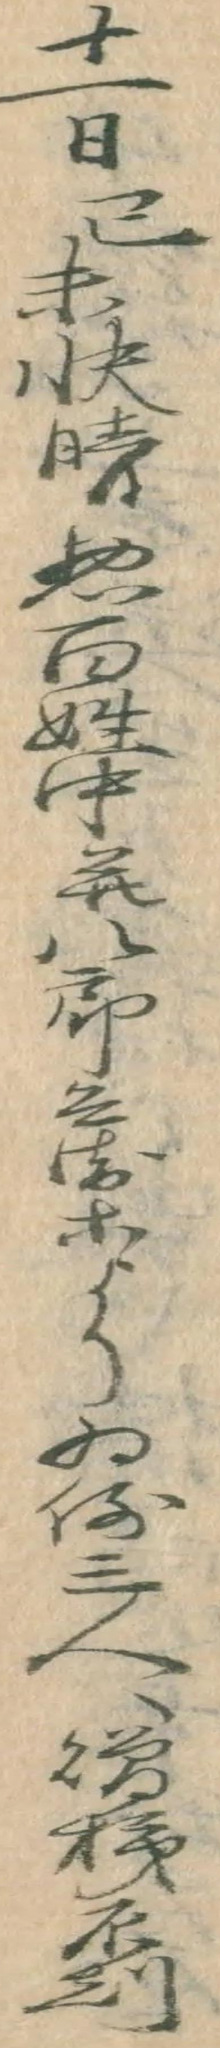十一日己未快晴惣百姓中并八郎兵衛等より為例三人へ贈梯辰刻

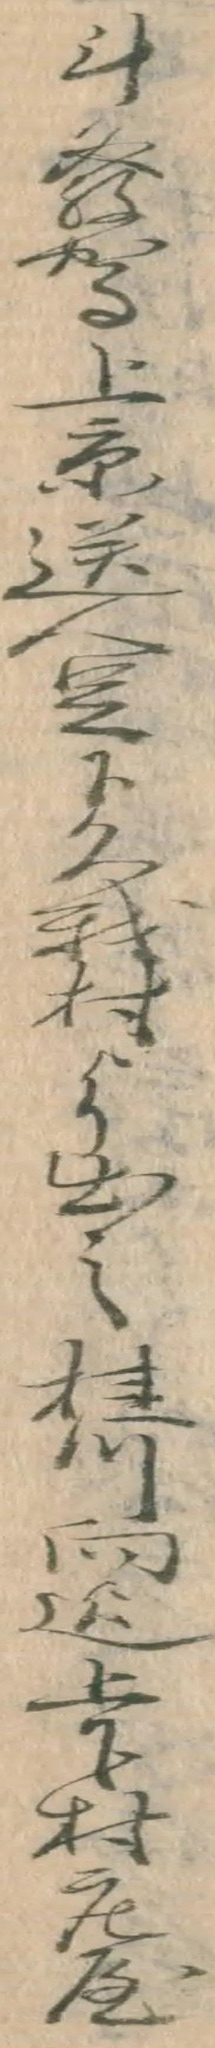斗発駕上京送人足下久我村より出之桂川向迄上下村庄屋
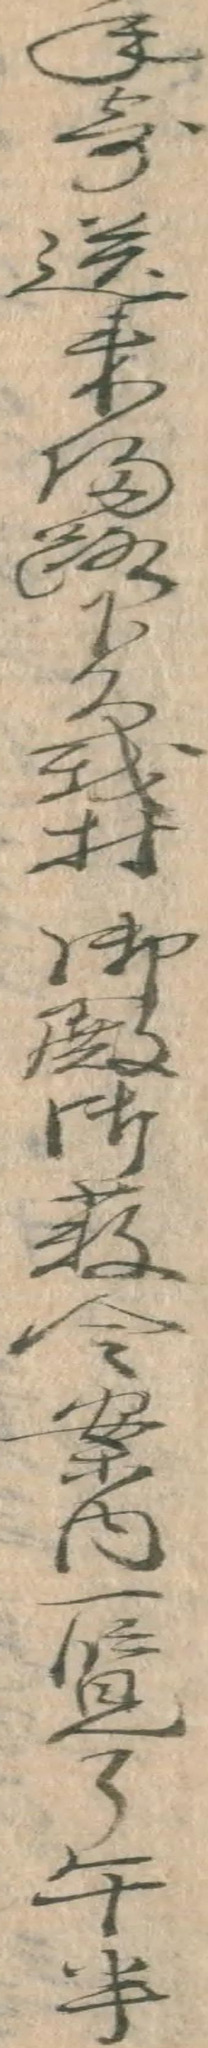年寄送来帰路下久我村御殿御藪令案内一覧了午半
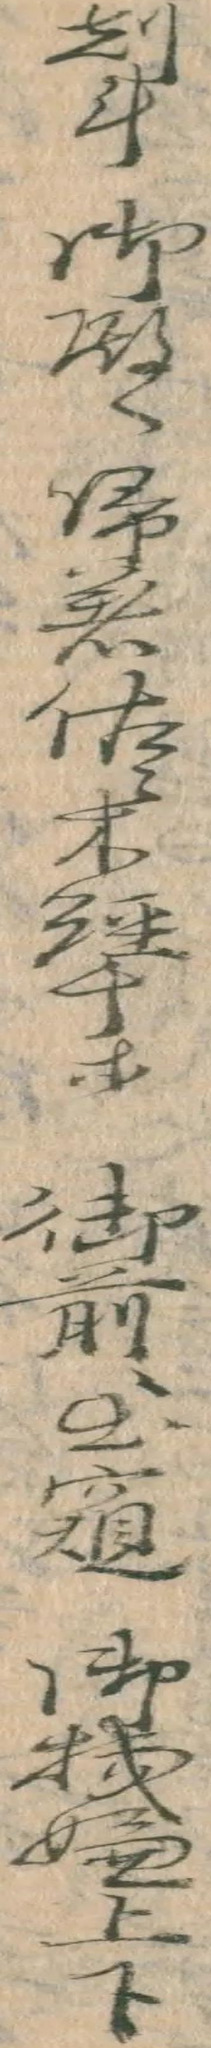刻斗御殿へ帰着佐々木経千等御前へ出窺御機嫌上下
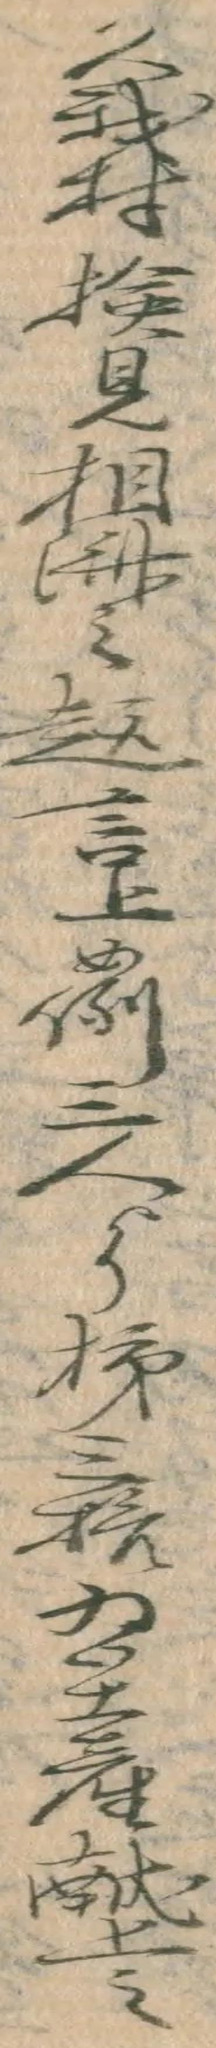久我村検見相済之趣言上如例三人より柿三拾為御土産献上之
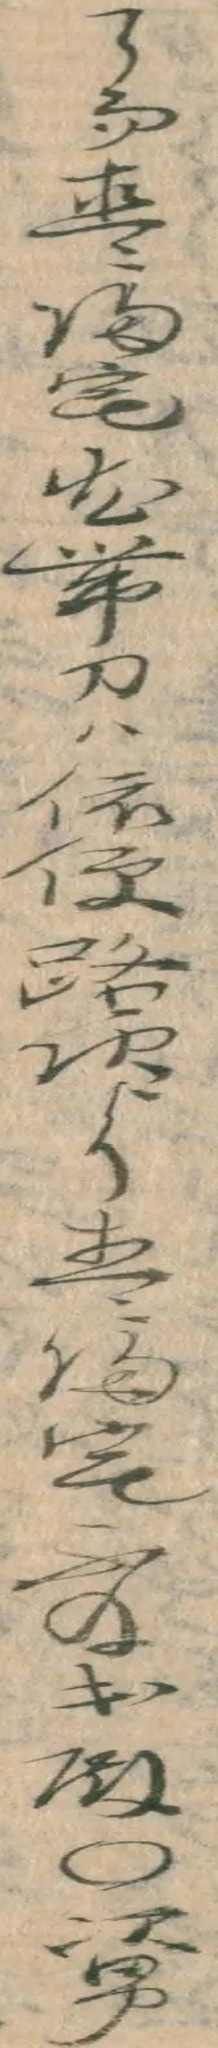了而直二帰宅尤帯刀ハ依便路次より直ニ帰宅不及出殿○次男
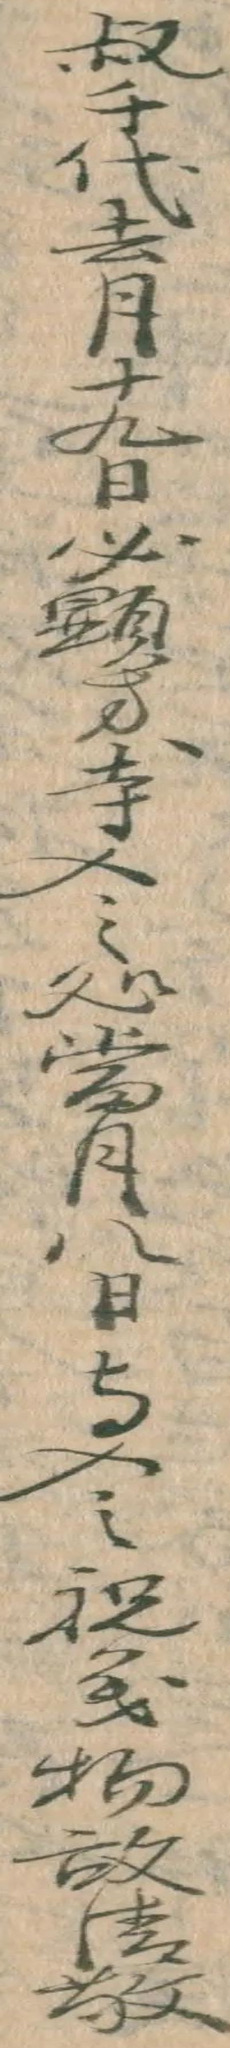叔千代去月十九日必顕方寺人之処當月八日寺入之祝義物故清敬
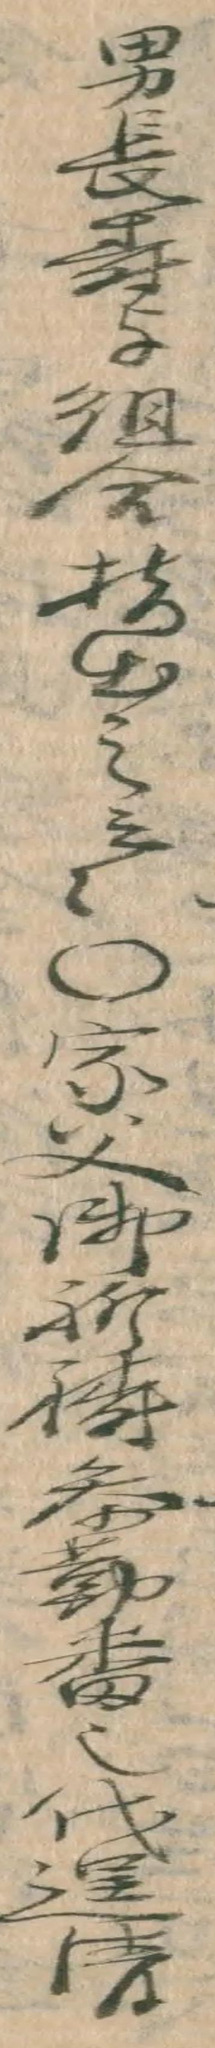男長壽与組合指出之云々〇家父御祈祷参勤番也代逞清
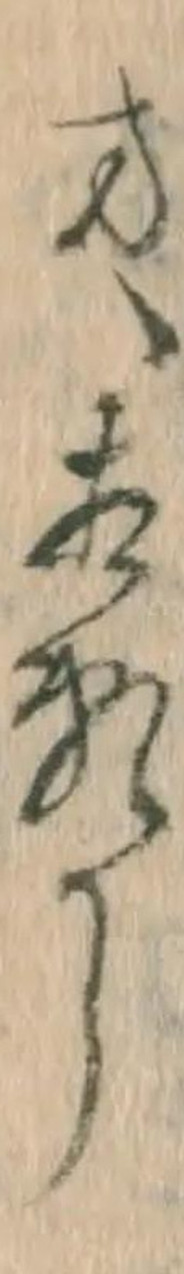方へ相頼了
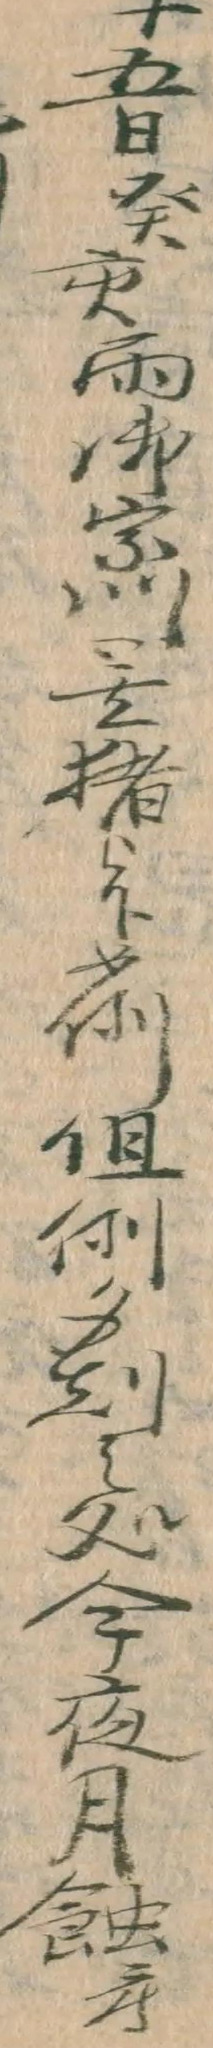十五日癸亥雨御家門御玄猪被下如例但例夕刻之処今夜月蝕ニ付
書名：賀茂社記録. 第65冊
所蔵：国立国会図書館 National Diet Library, JAPAN
